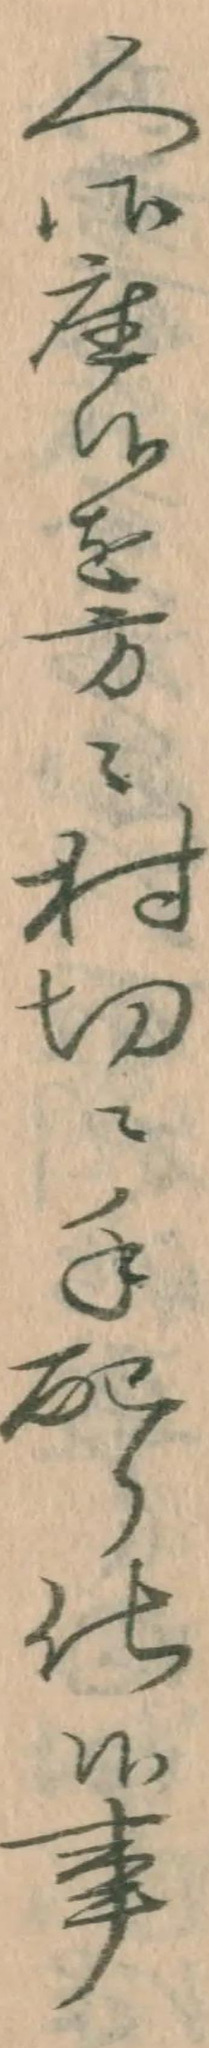人御座候を方々村切に手配り仕候事
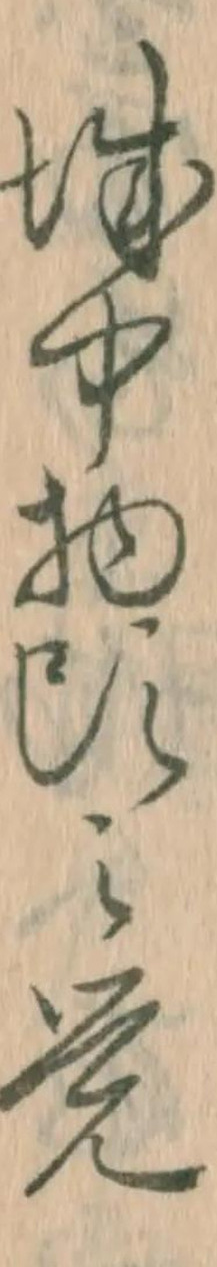城中物頭之覚
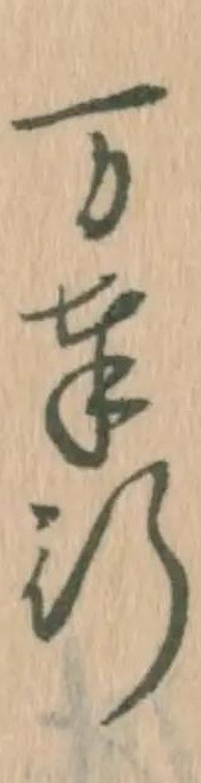万奉行
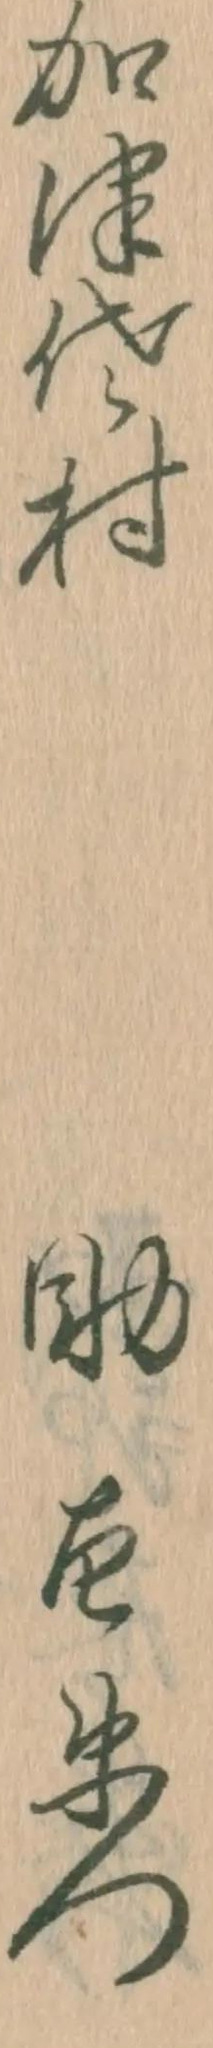加津佐村助左衛門
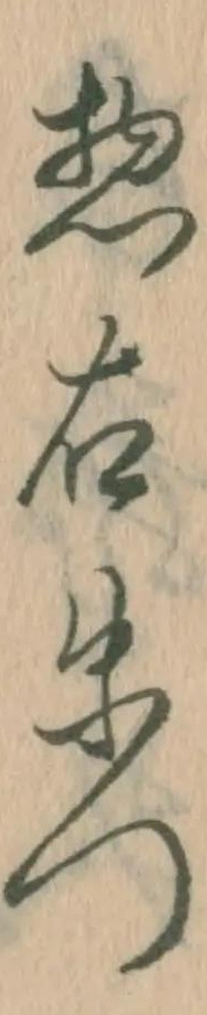惣右衛門
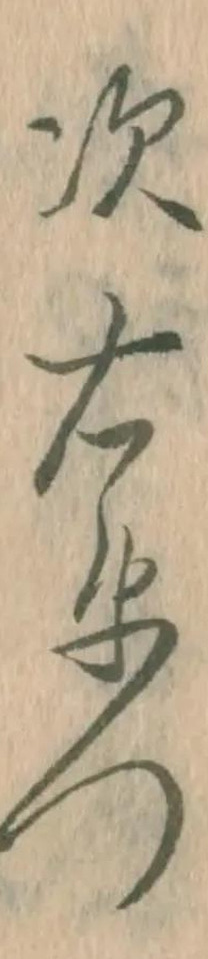惣右衛門
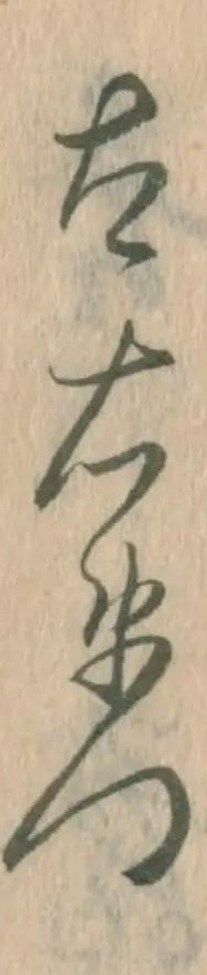惣右衛門
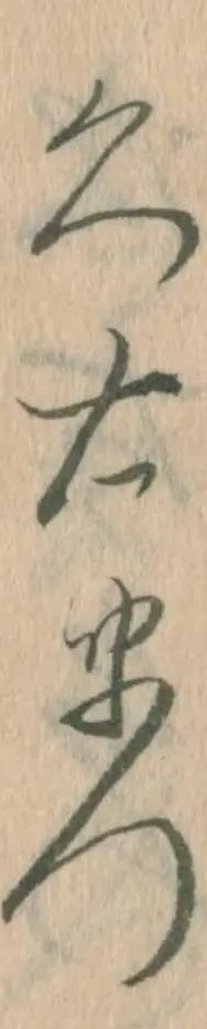惣右衛門
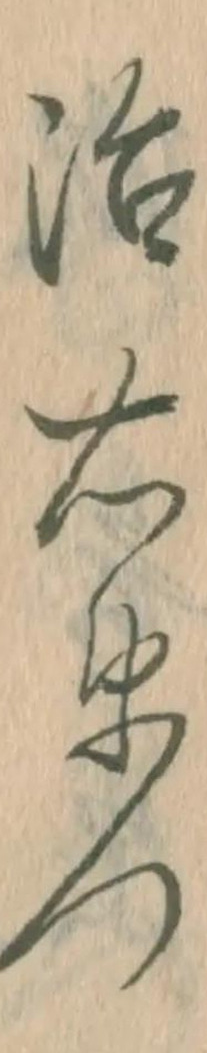治右衛門

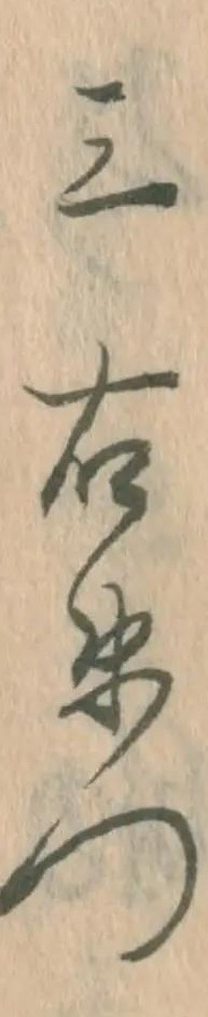次右衛門
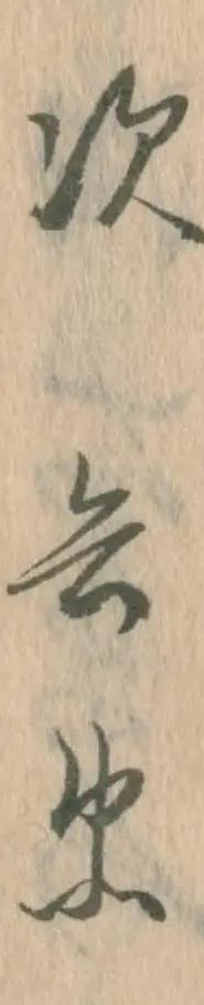次兵衛
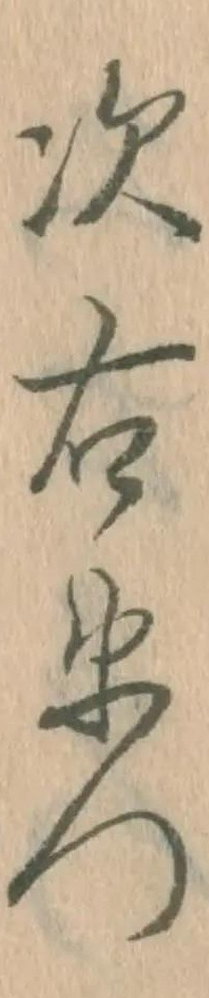次右衛門
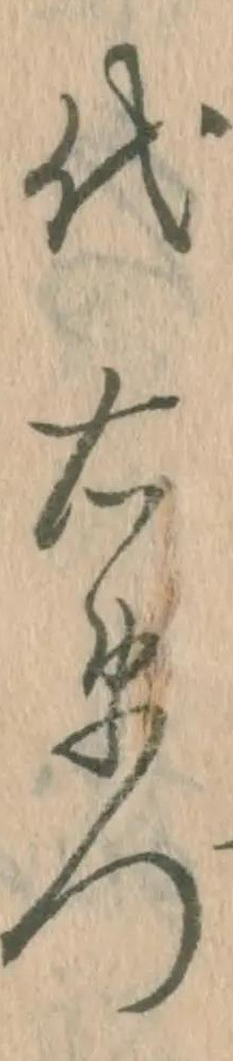代右衛門
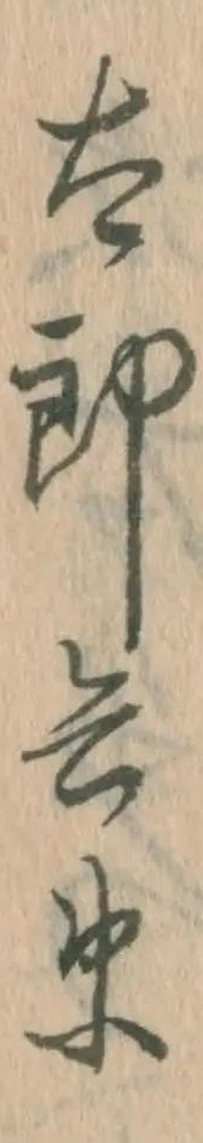太郎兵衛
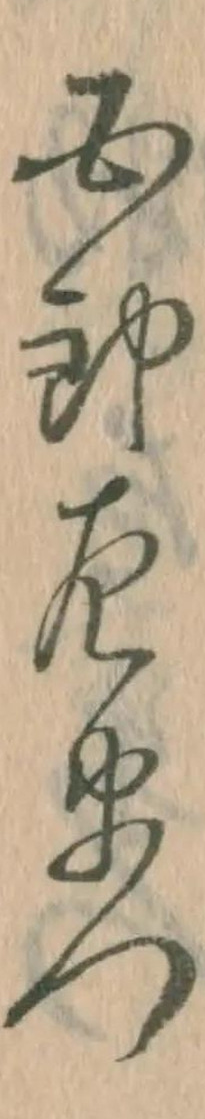五郎左衛門
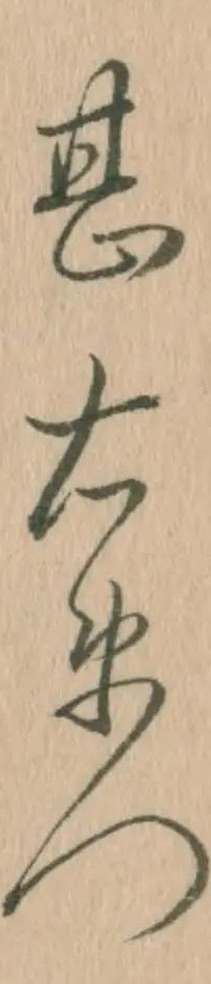甚右衛門
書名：切支丹御退治記 49巻. [9]
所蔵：国立国会図書館 National Diet Library, JAPAN
